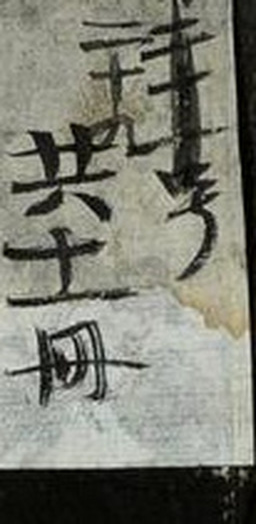共十一冊
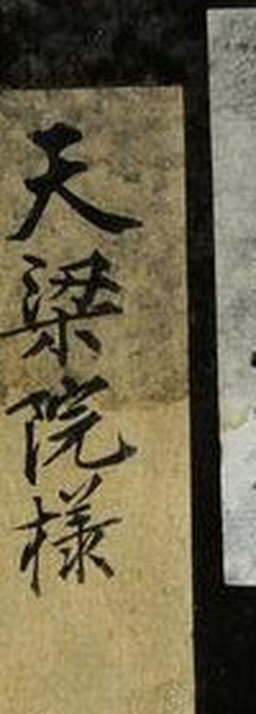天梁院様
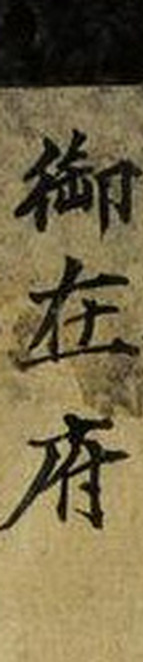御在府
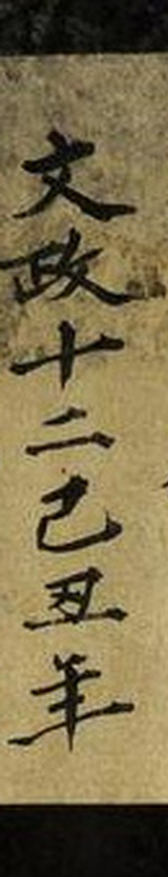文政十二己丑年
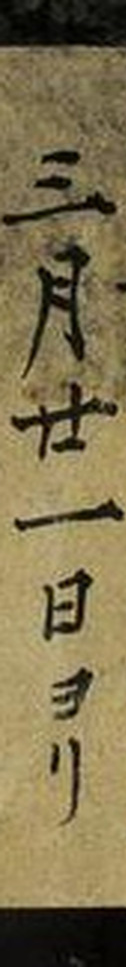三月廿一日ヨリ
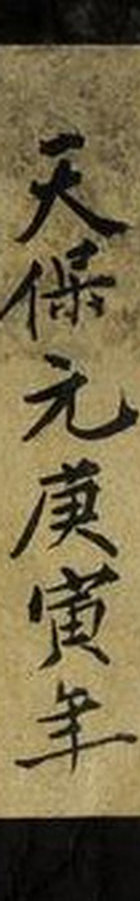天保元庚寅年
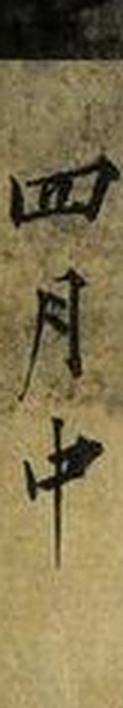四月中
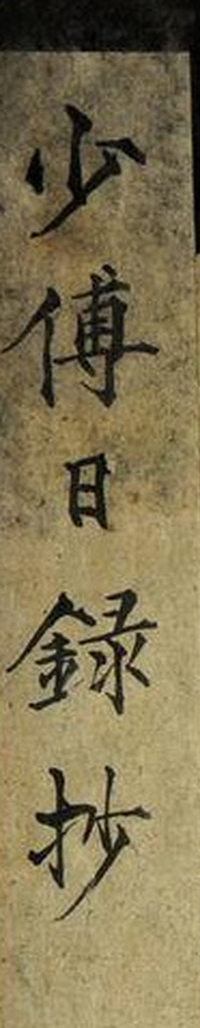少傅日録抄

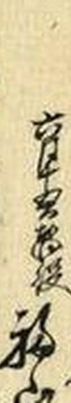六月十五日転役
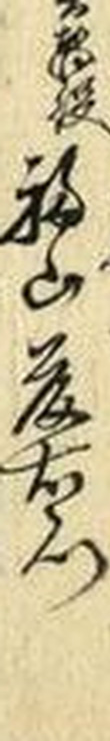福山藤右衛門
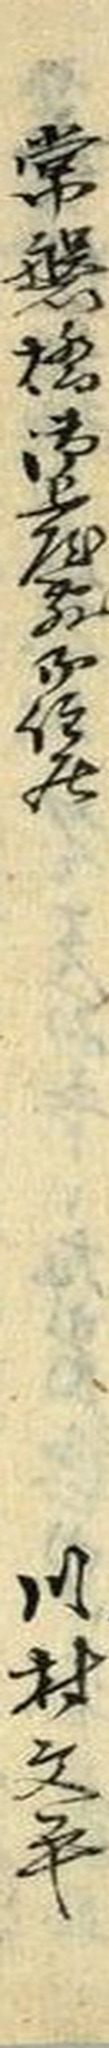常盤橋御上屋敷御住居熊谷小兵衛
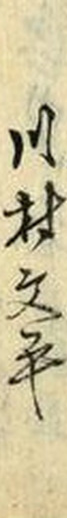川村文平
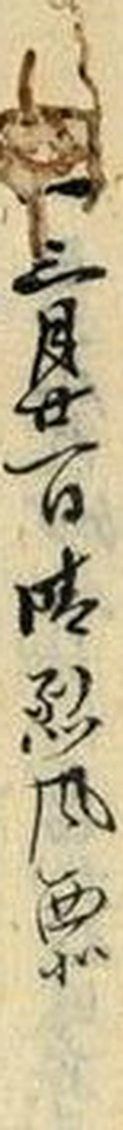一三月廿一日晴烈風西北
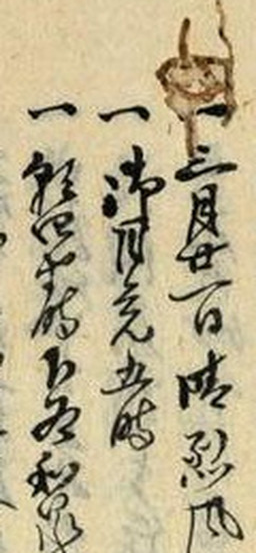一御目覚五時
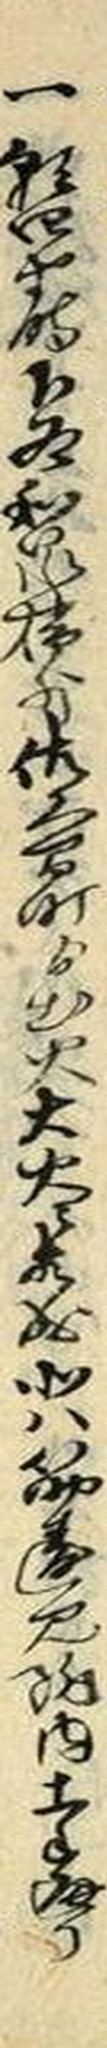一朝四半時下谷和泉橋佐久間町ゟ出火大火ニ相成北ハ筋違見附内土手通り
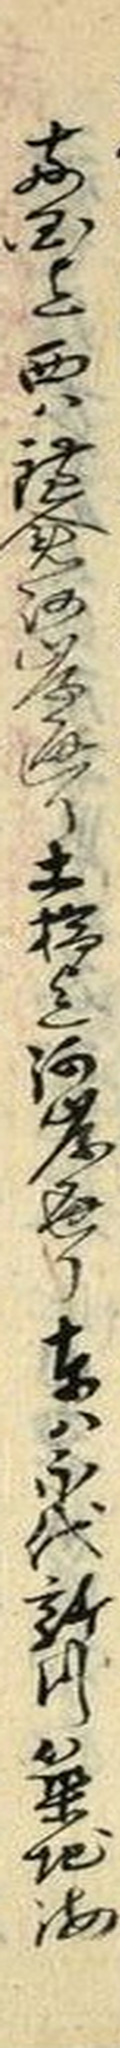両国迄西ハ鎌倉河岸通り土橋迄河岸通り東ハ永代新川築地海
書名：少傅日録抄（斉承付側向頭取日記、在府）
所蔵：福井県文書館 Fukui Prefectural Archives
